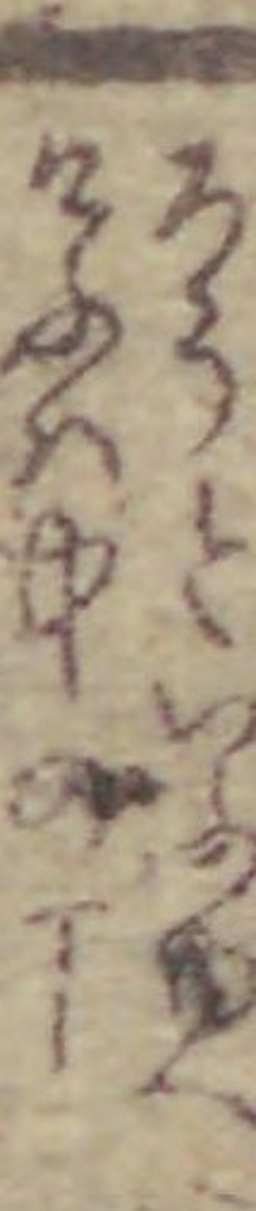けふは中の丁
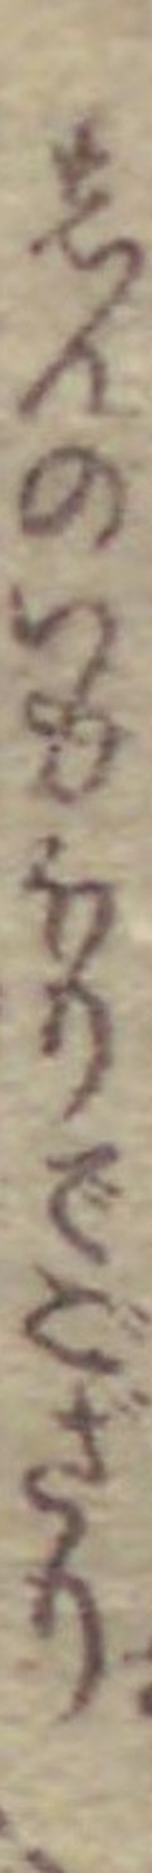しんのいもほりでござり
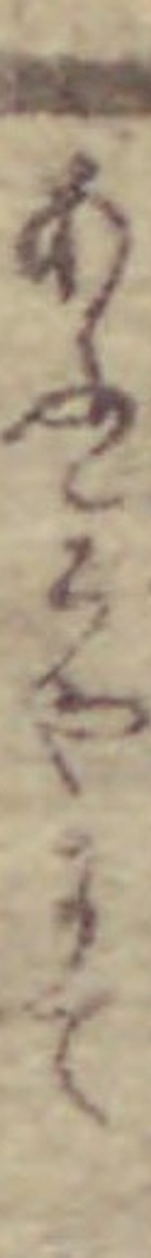あふみやにて
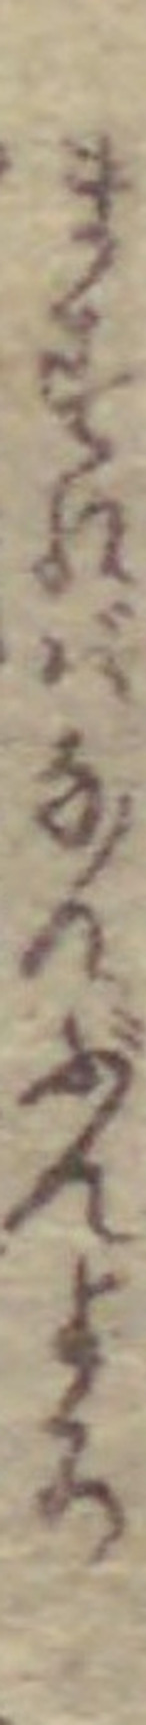ますればなんぶんよろ
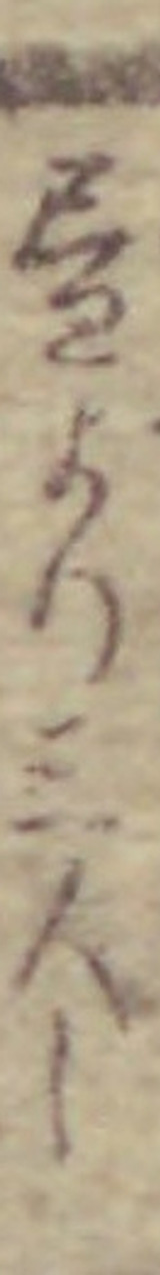昼より三人し
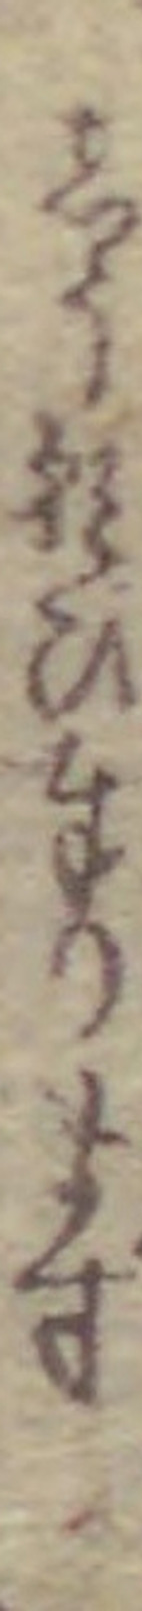しう願ひ奉ります
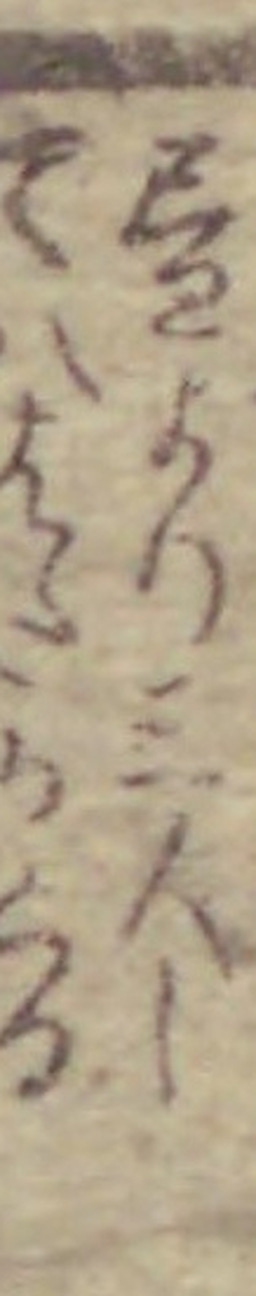て八はたかくる
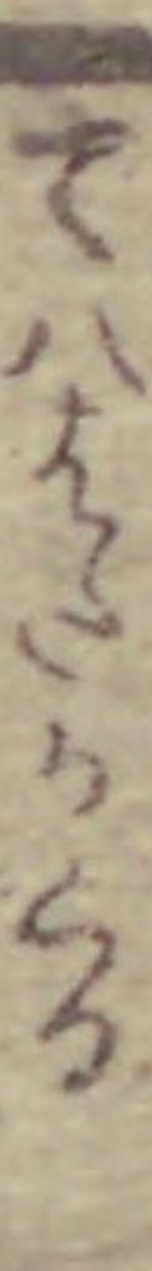て八はたかくる
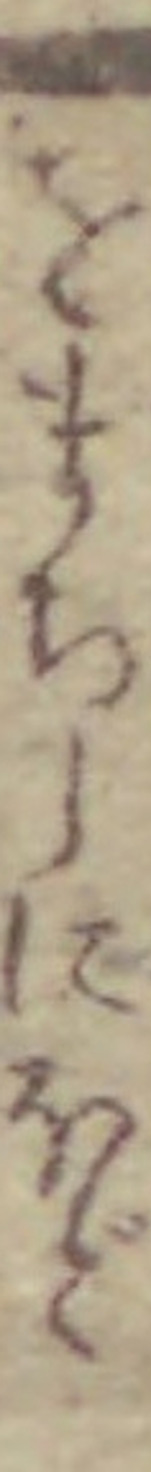をまちしにほど
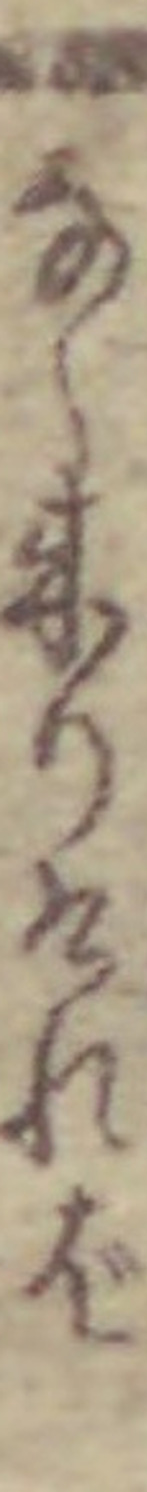なく来りければ
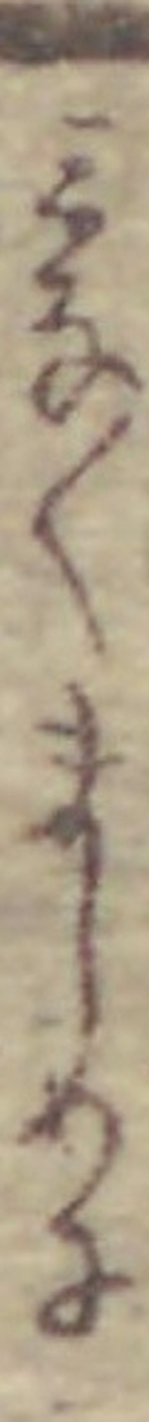みな〳〵ましめに
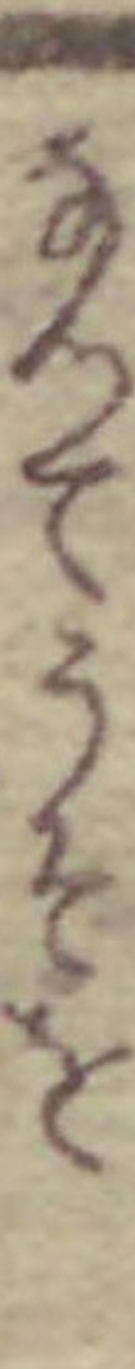なつてうそを
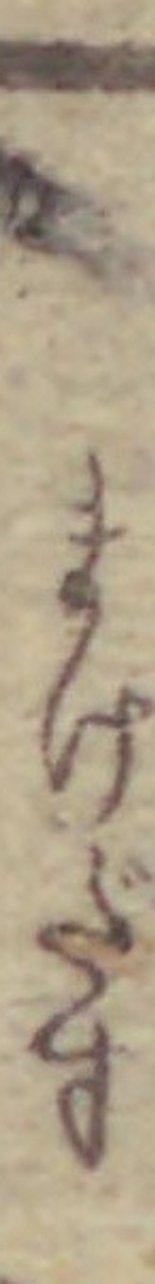まけだす
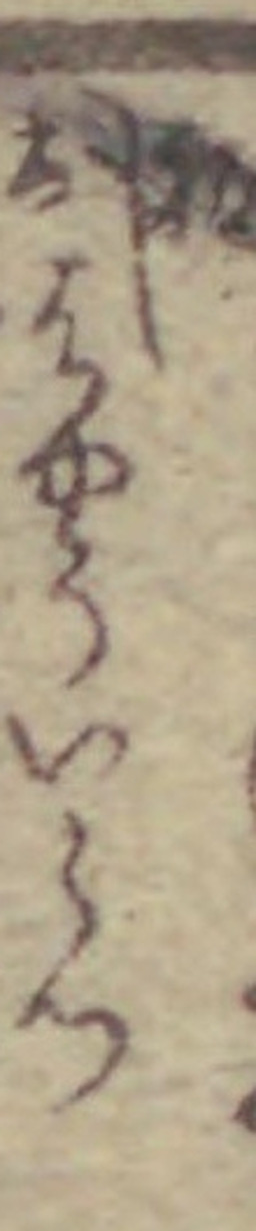「おはやういらつ
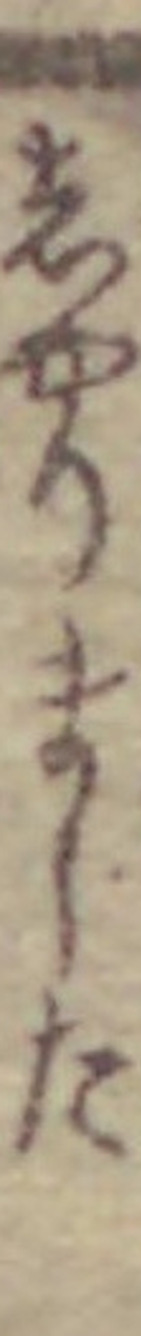しやりました
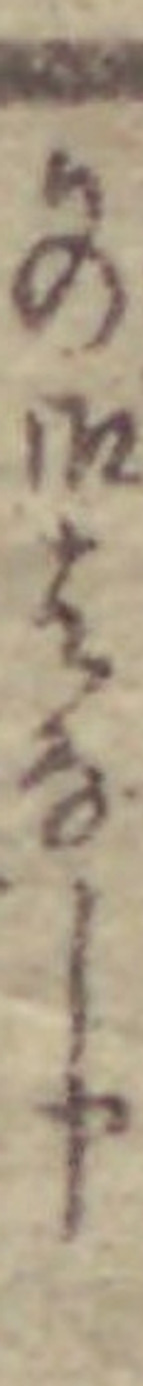かの御はなし申
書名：間似合嘘言曽我 3巻
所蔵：国立国会図書館 National Diet Library, JAPAN
